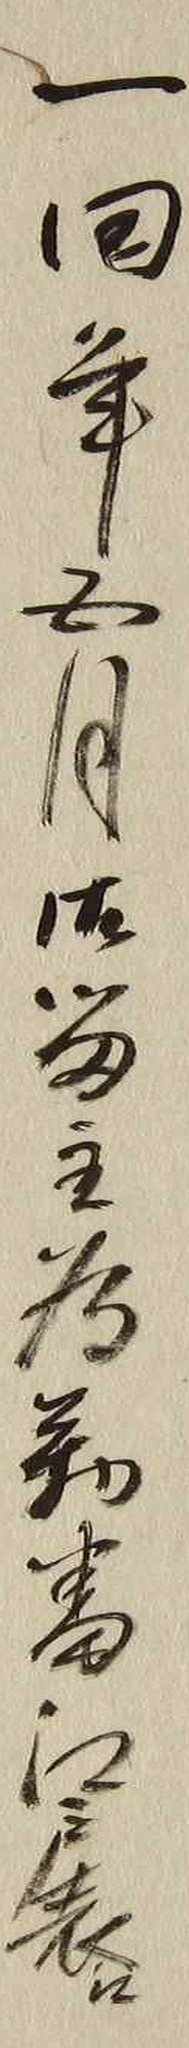一同年五月御留主為勤番江戸表江
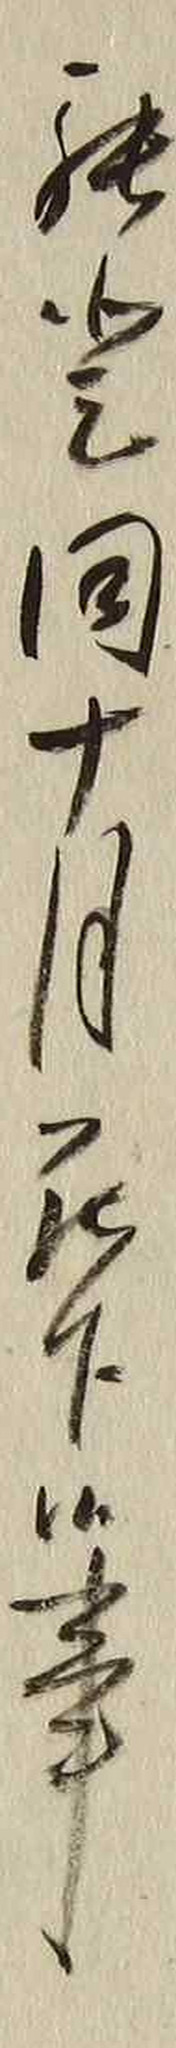罷登同十月罷下候事
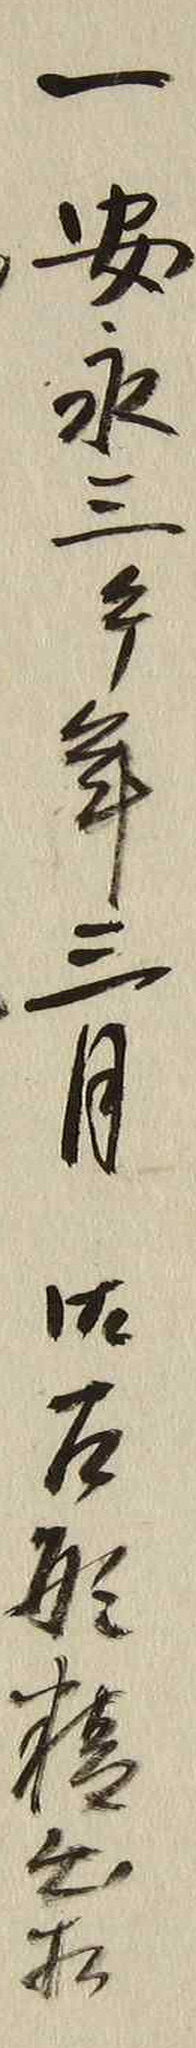一安永三午年三月御召形精出相
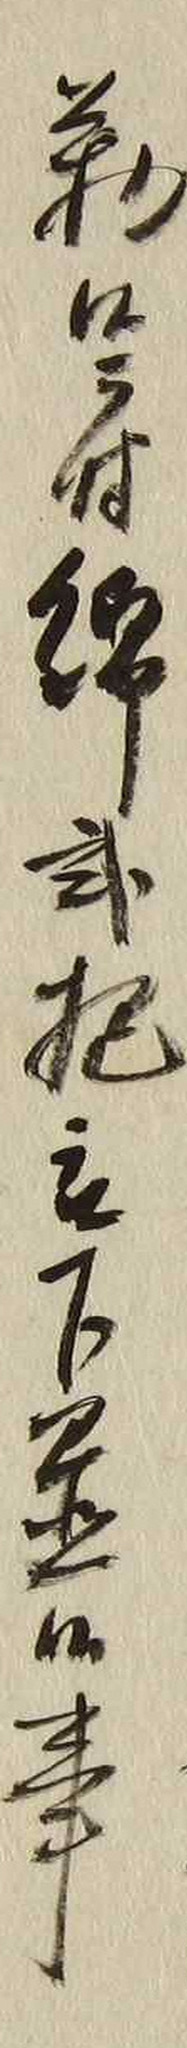勤候に付綿弐把被下置候事
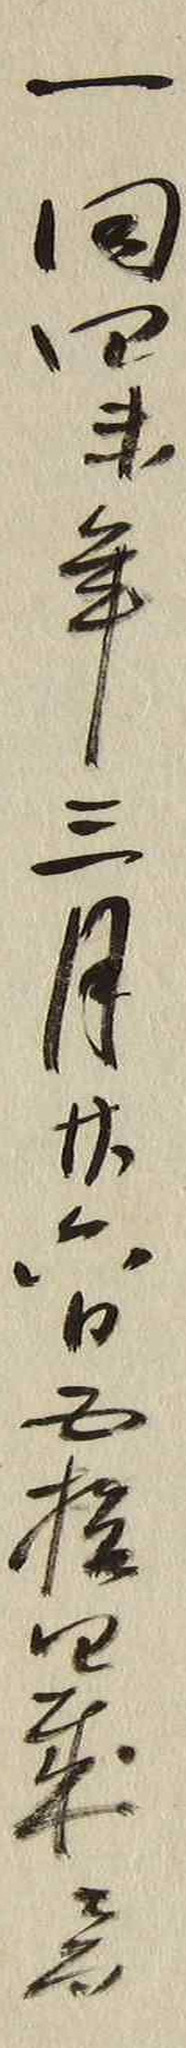一同四未三月廿六日五拾四歳に而
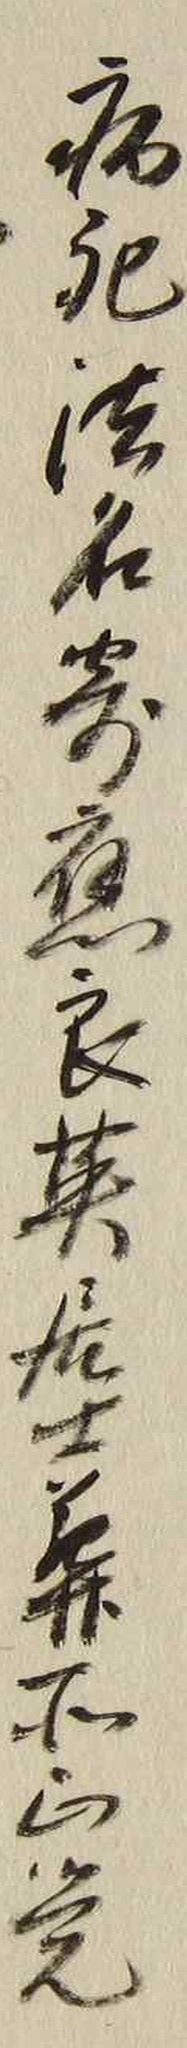病死法名寄応良英居士葬所正覚
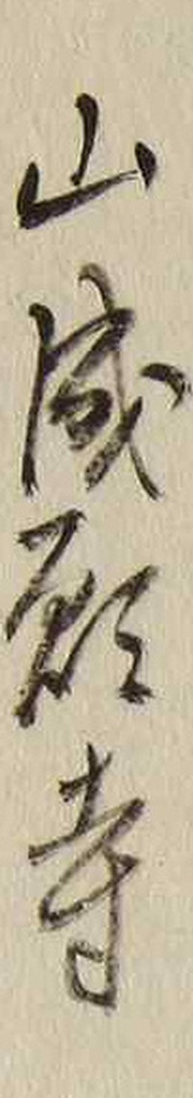山成願寺

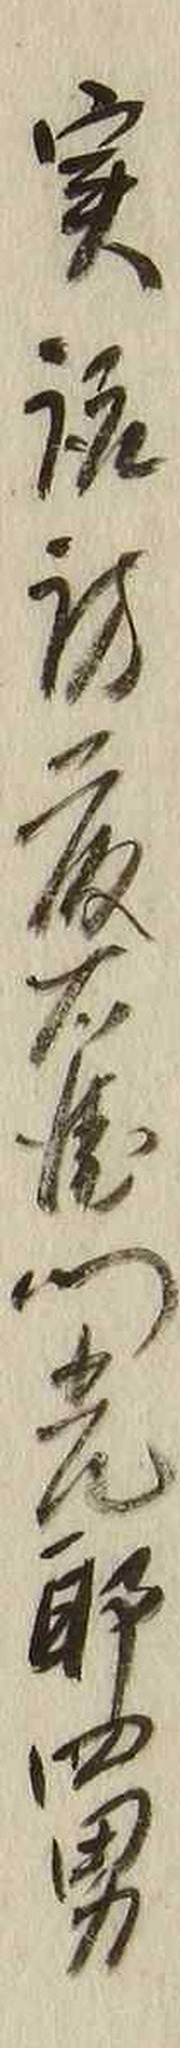実諏訪藤右衛門光耶四男
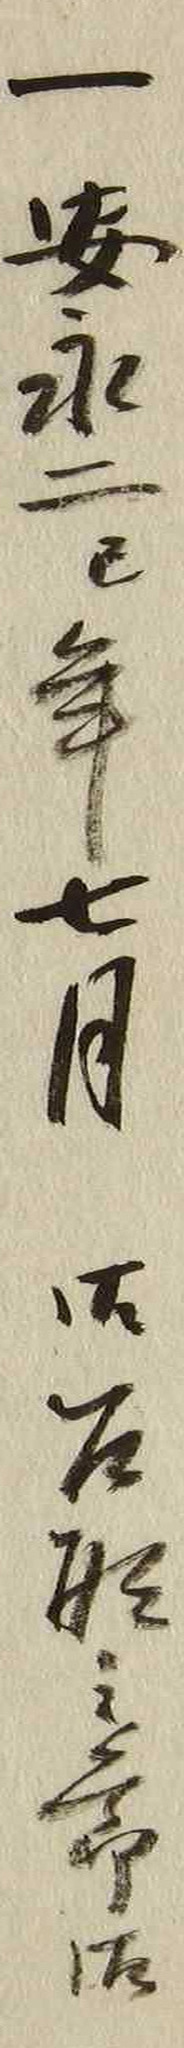一安永二巳年七月御召形之節御
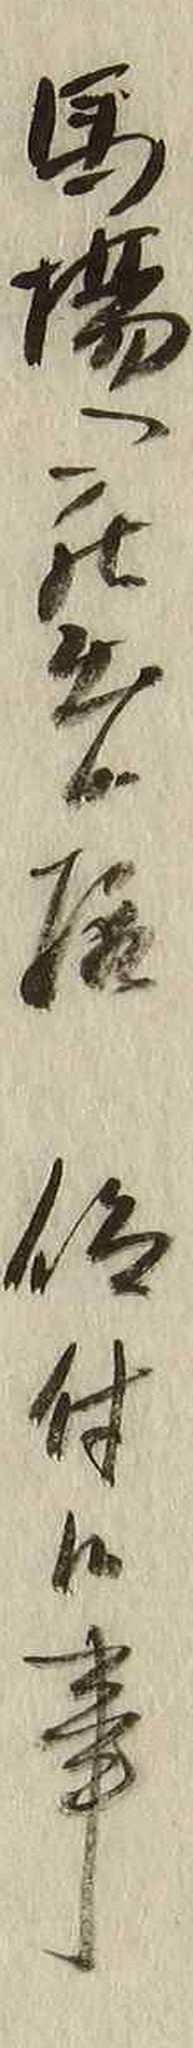馬場へ罷出候様仰付候事
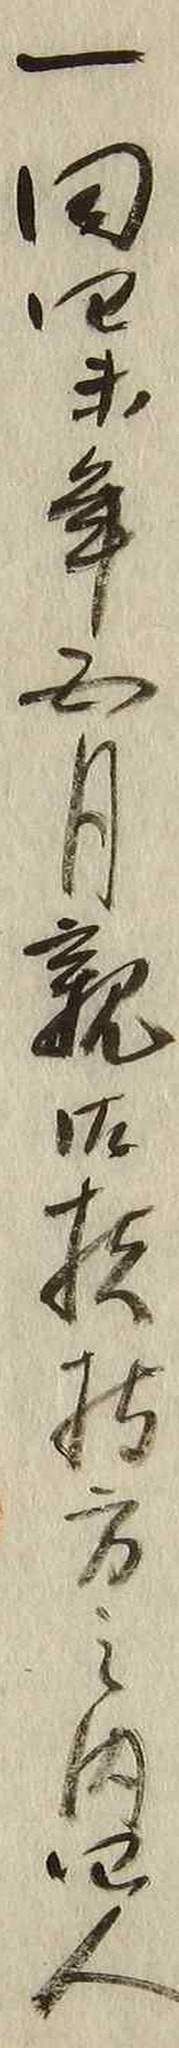一同四未年五月親御扶持方之内四人
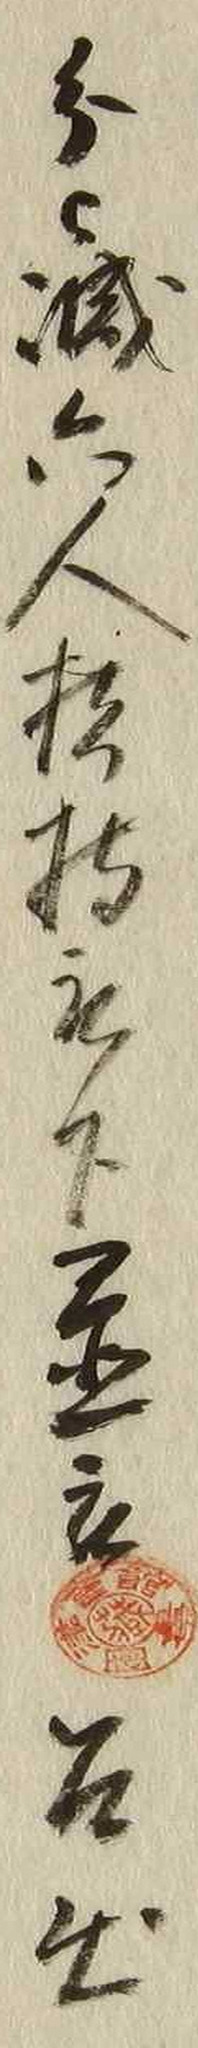分被減六人扶持被下置被召出
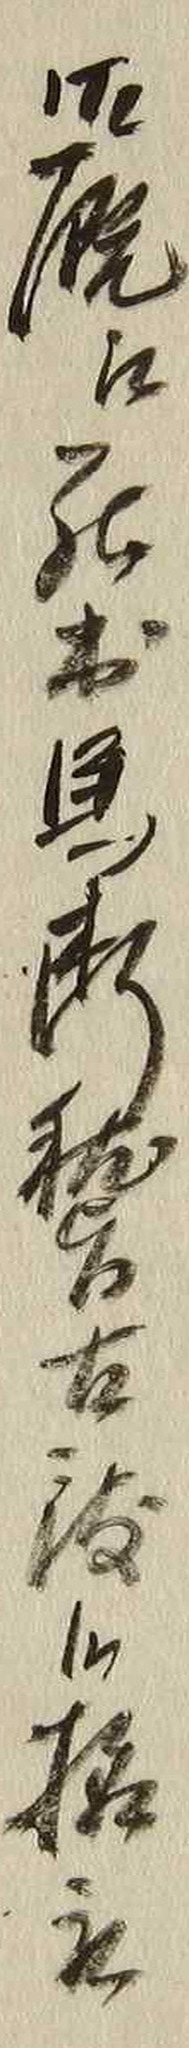御厩江罷出馬術稽古致候様被
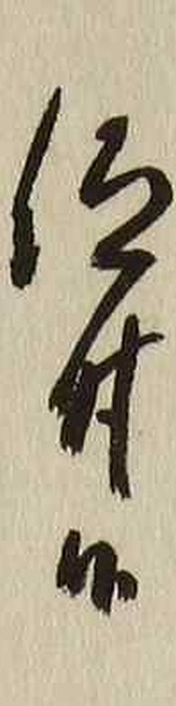仰付候
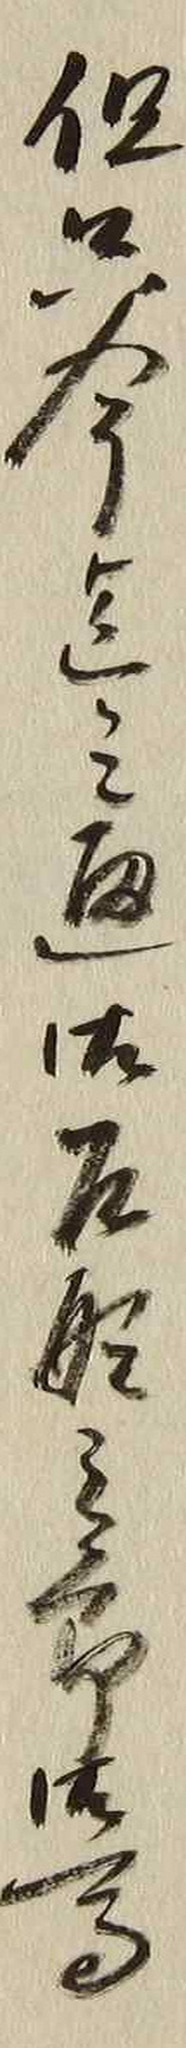但只今迄之通御召形之節御馬
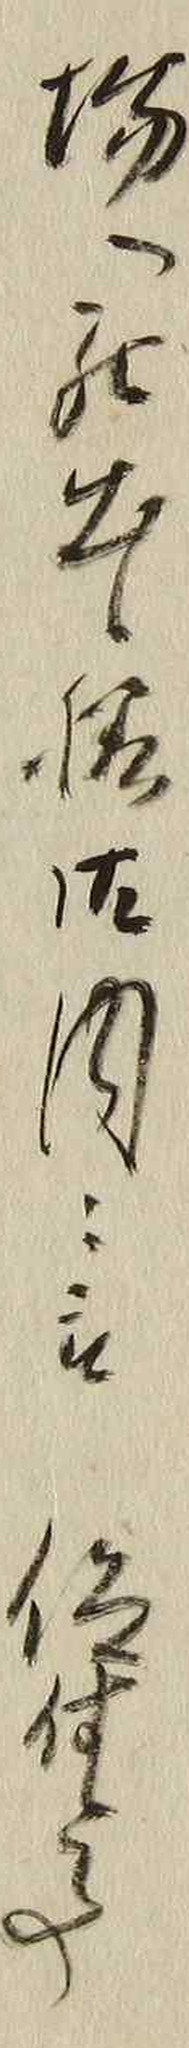場へ罷出候様御内々被仰付候事
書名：諸士系譜　巻之360　す之部10
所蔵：会津若松市立会津図書館
